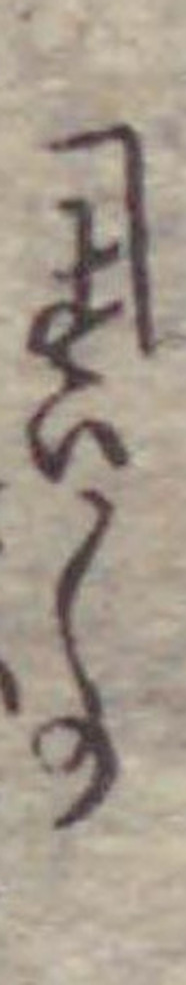〽すい〳〵の
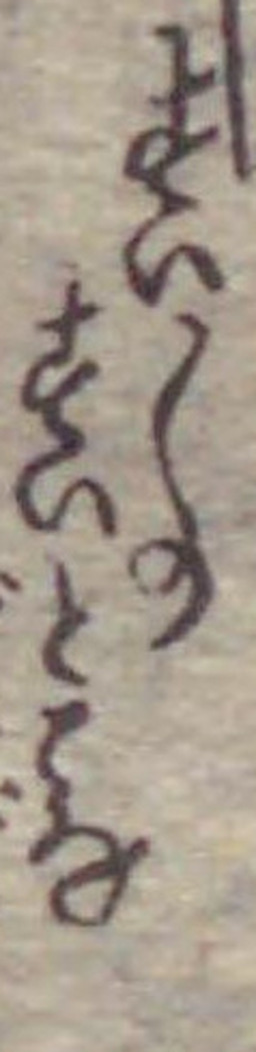すいとてな
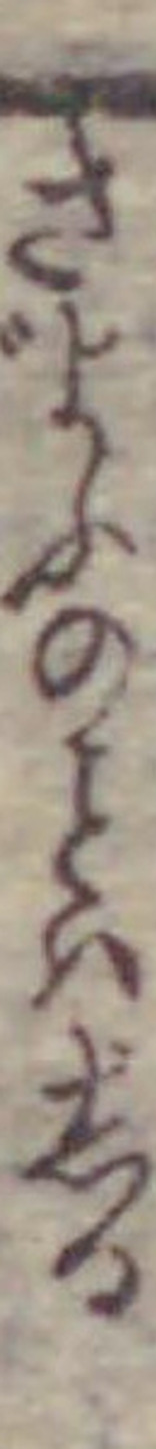さよふのことはしる
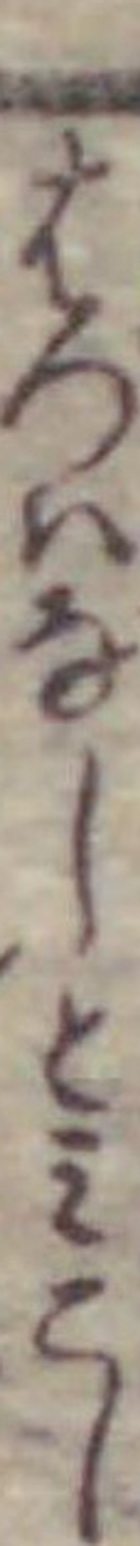はづはなしとみこし
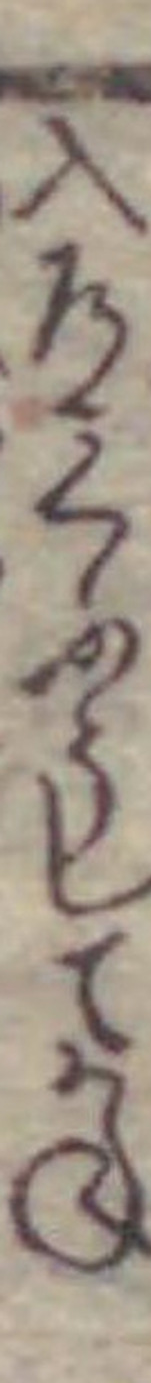入道くふうしてかね
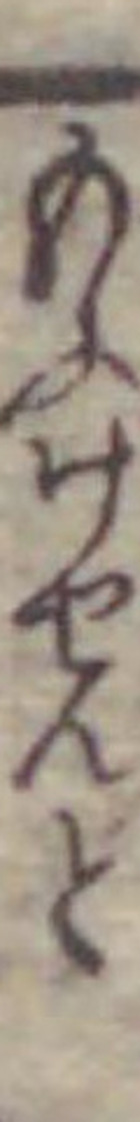もふけせんと
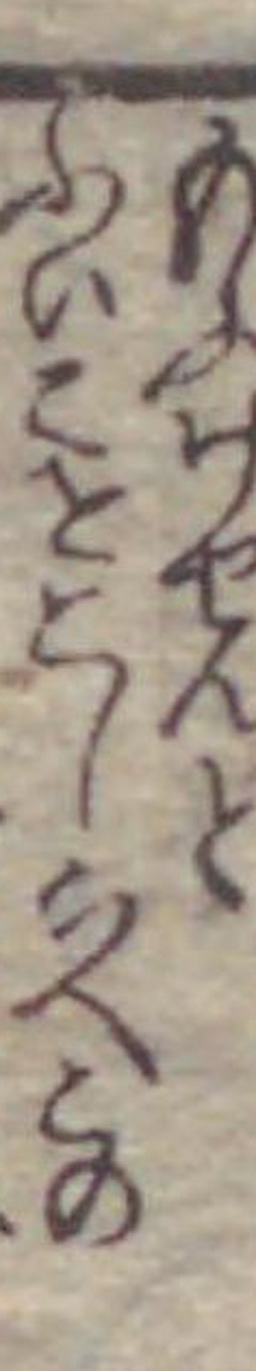ふいこをこしらへこの
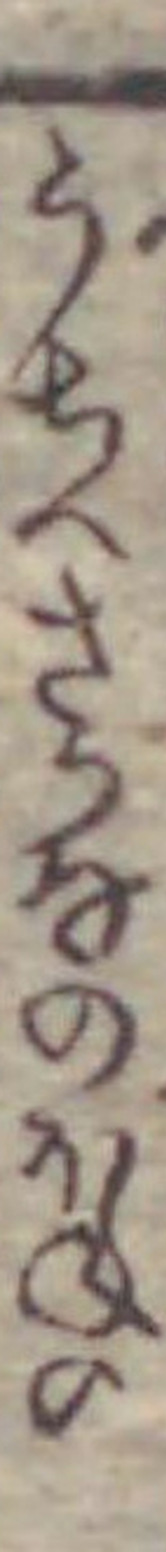うちへさかなのほねの
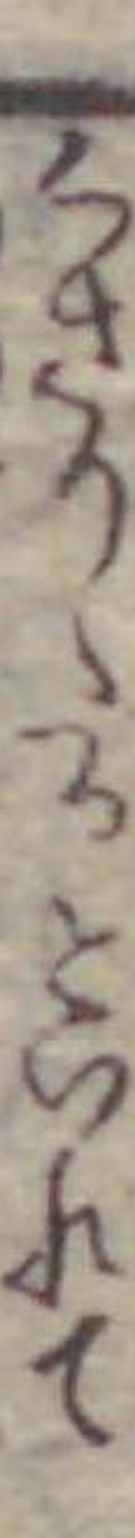くさりたるといれて
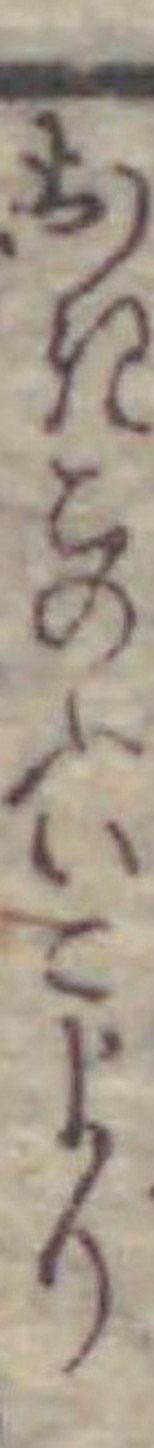おきこのふいこより
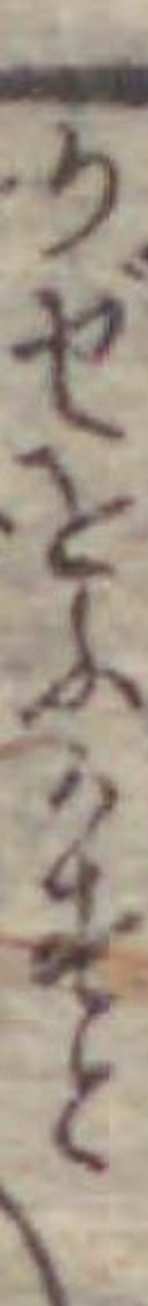かぜをふかすと
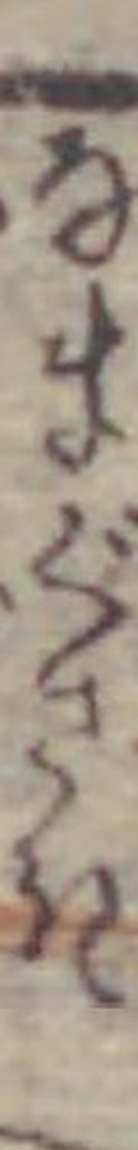なまぐさき
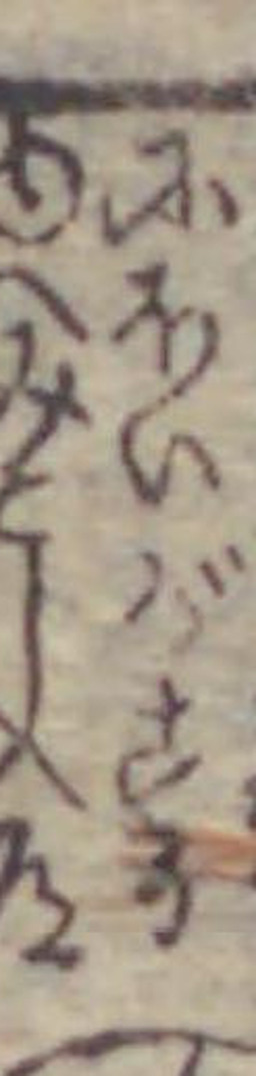ゆへみこし入道
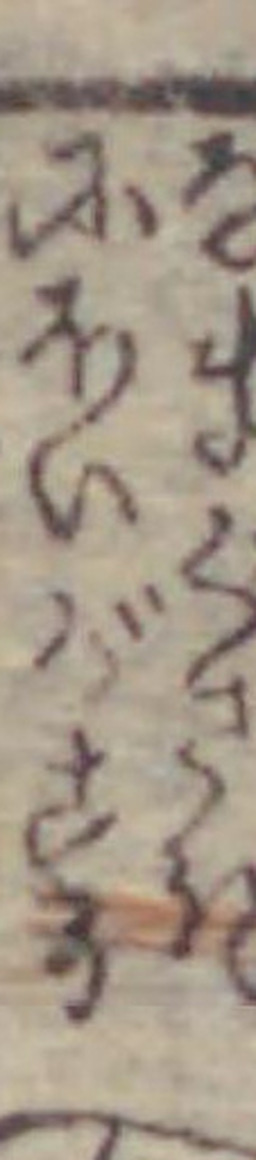にほいがする
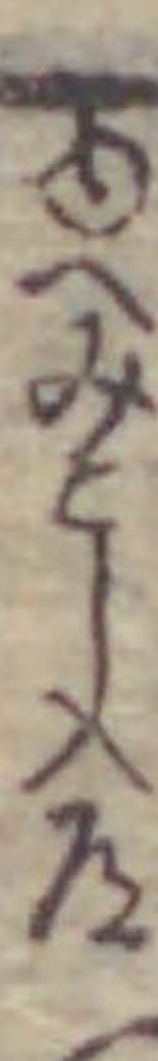ゆへみこし入道
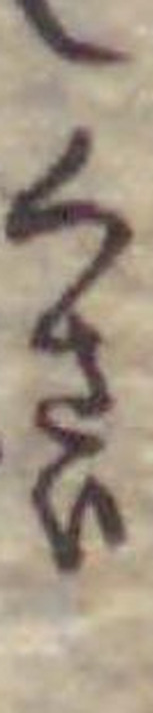くさい
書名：化物見世開 : 2巻
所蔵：国立国会図書館 National Diet Library, JAPAN
